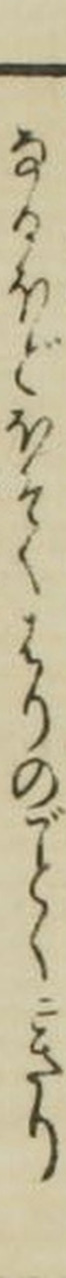なるほどほそくはりのごとくにきり
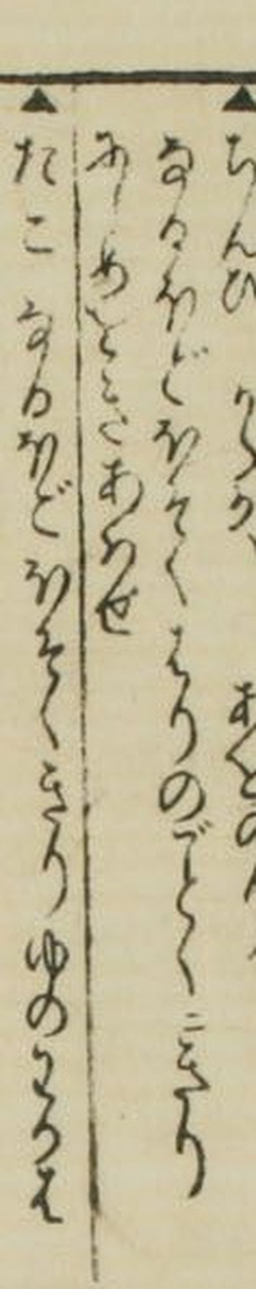にしめをきあはせ
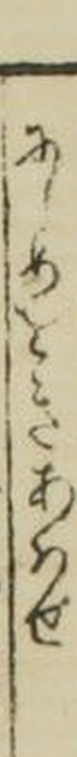にしめをきあはせ
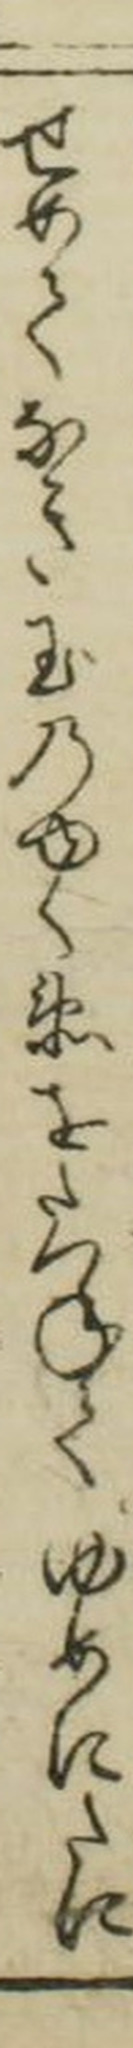せめてなき玉のゆくゑをたつねて。ゆめにだに
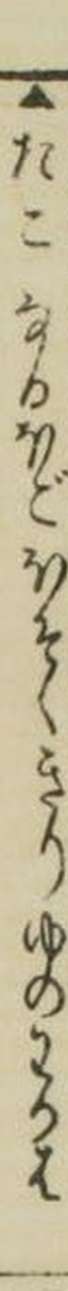▲たこなるほどほそくきりゆのわかは
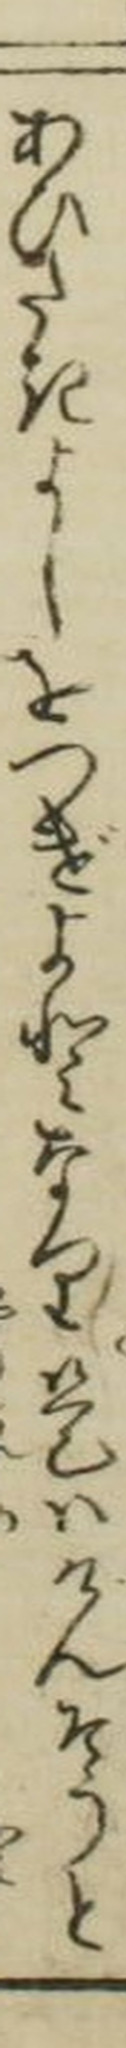あひたきよしをつげよとなり。是はげんそうと
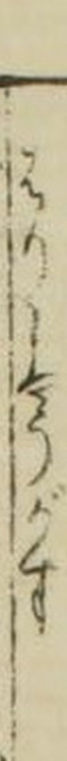はりしやうがす
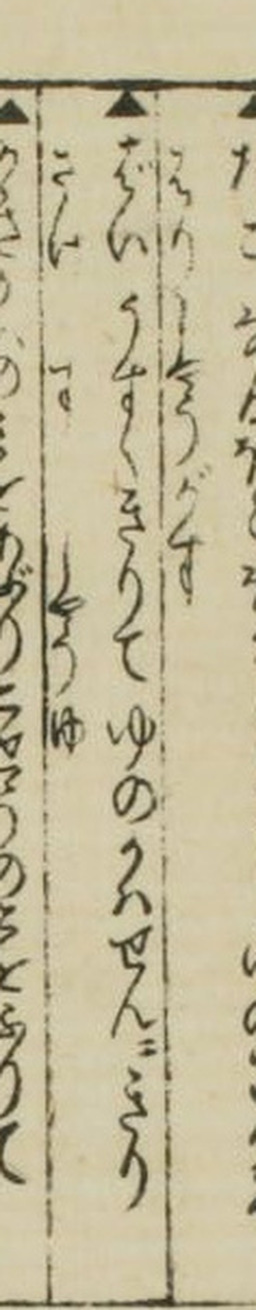▲ばいうすくきりてゆのかはせんにきり
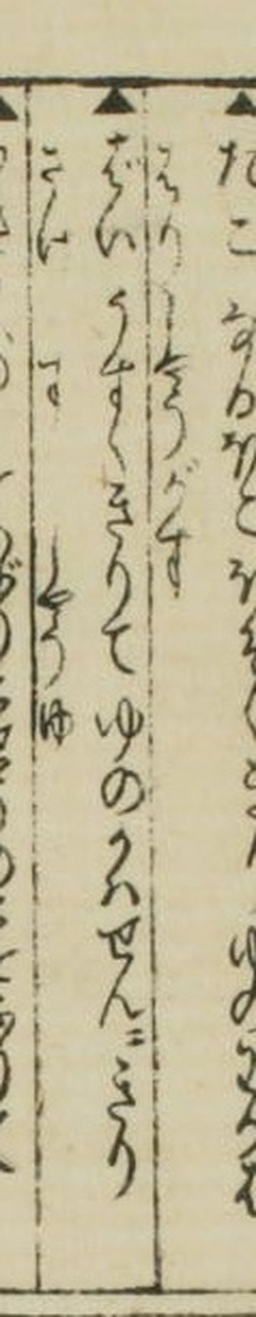▲ばいうすくきりてゆのかはせんにきり
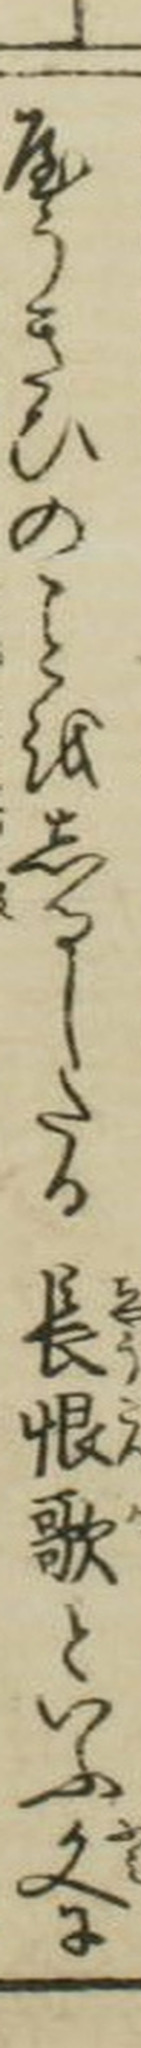やうきひのことをしるしたる長恨歌といふ文に
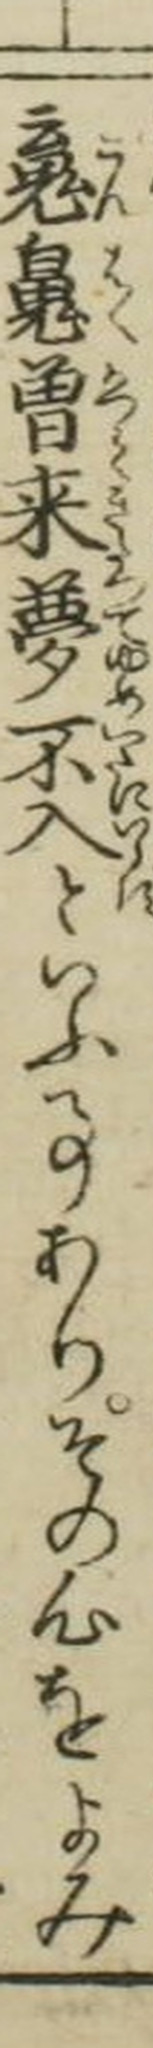魂魄曽来夢不入といふ事あり。その心をよみ
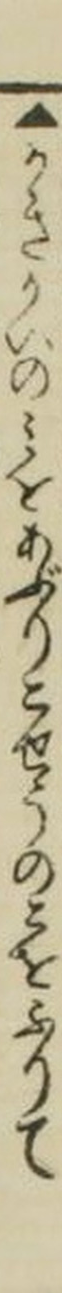▲かきかいのみをあぶりこせうのこをふりて
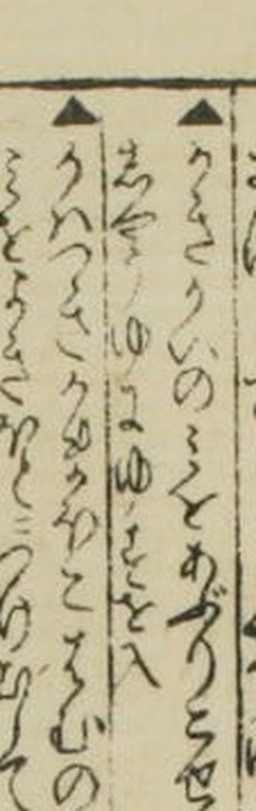しやうゆにゆすを入
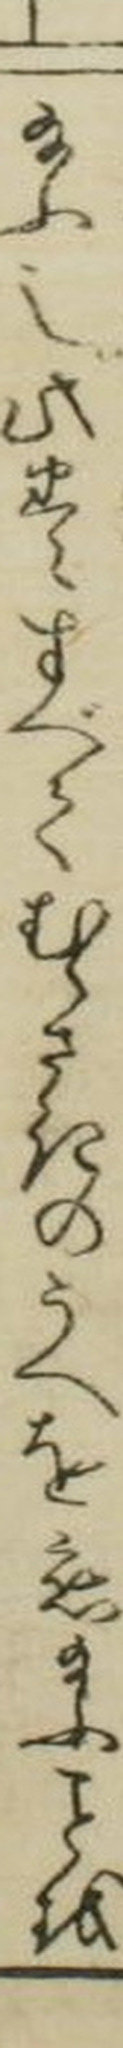給ふ也。此巻すべてむらさきのうへを恋給ふことを
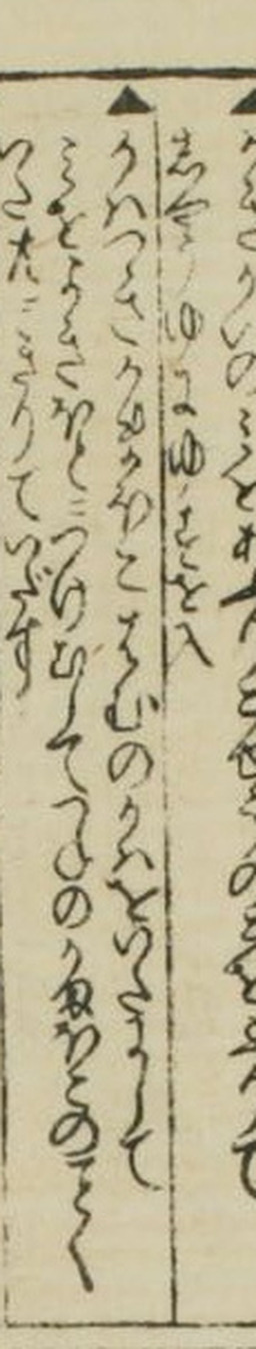▲かはつきかまほこはむのかはをいたにして
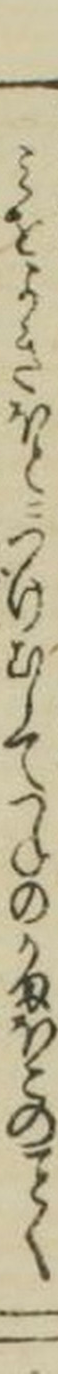みをよきほとにつけむしてつねのかまほこのことく
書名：女源氏教訓鑑
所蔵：東京学芸大学附属図書館
